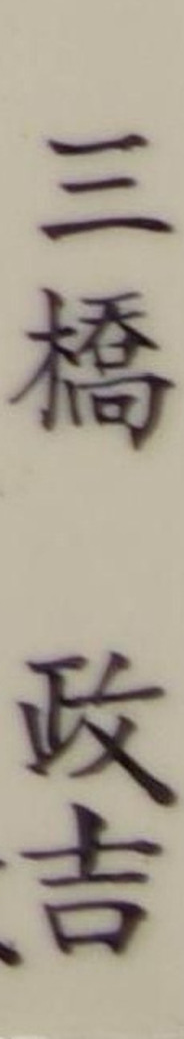三橋政吉
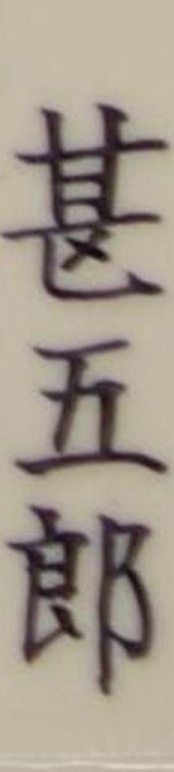甚五郎
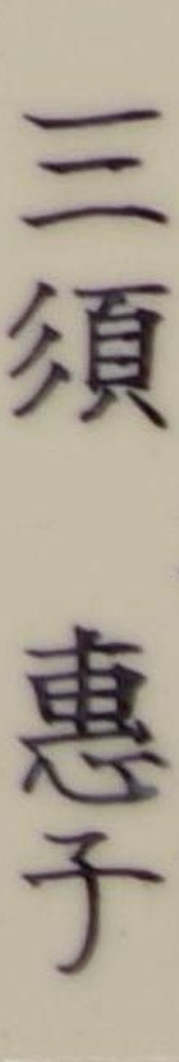三須恵子
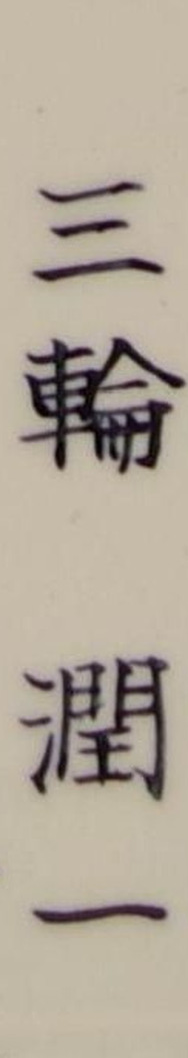三輪潤一
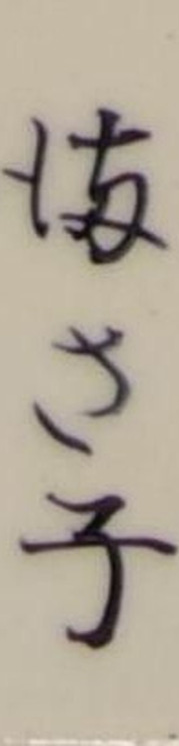まさ子
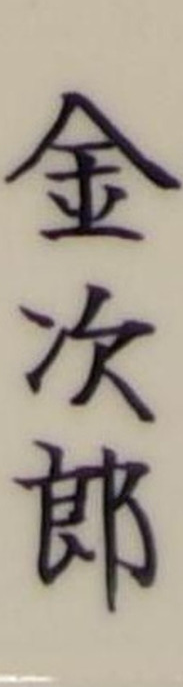金次郎
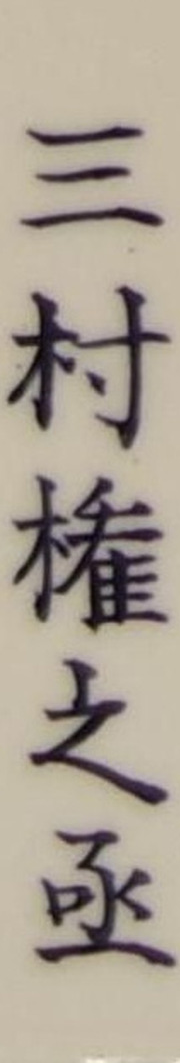三村権之丞
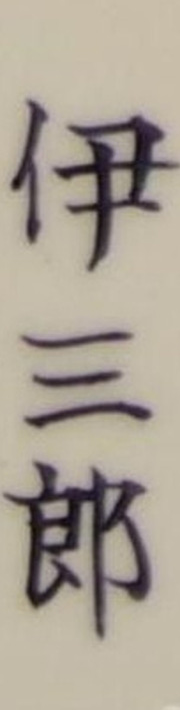伊三郎

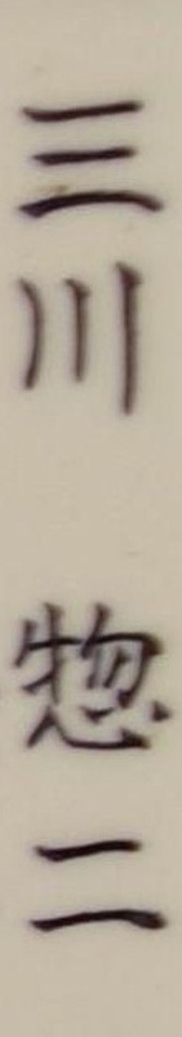三川惣二
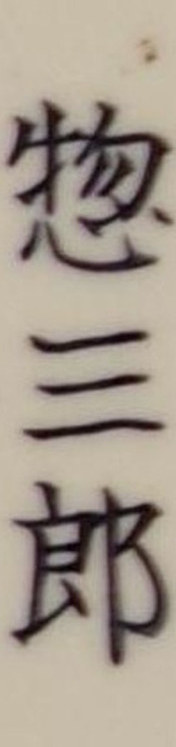惣三郎
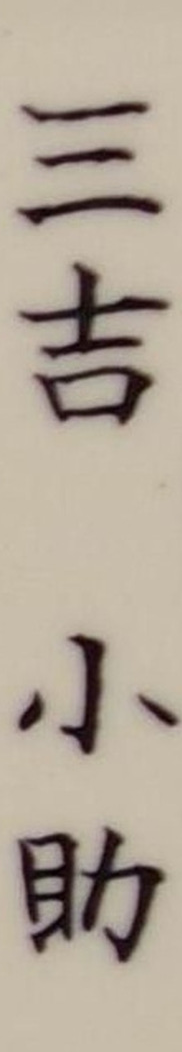三吉小助
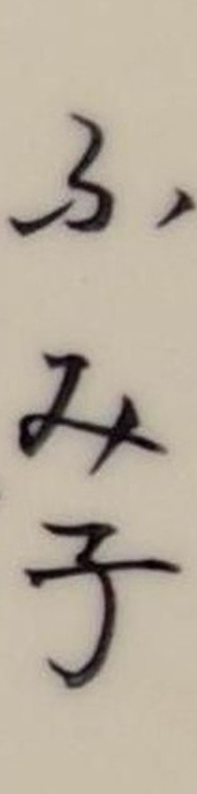ふみ子
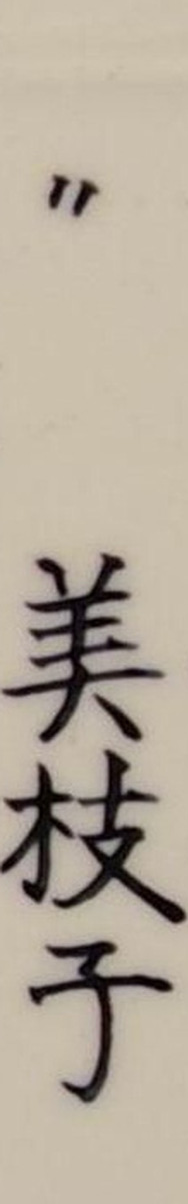美枝子
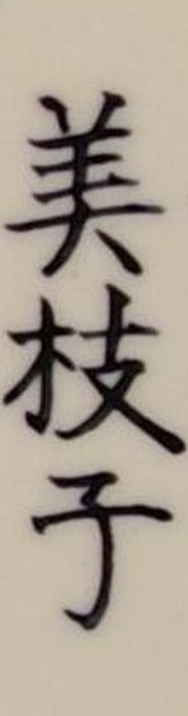美枝子
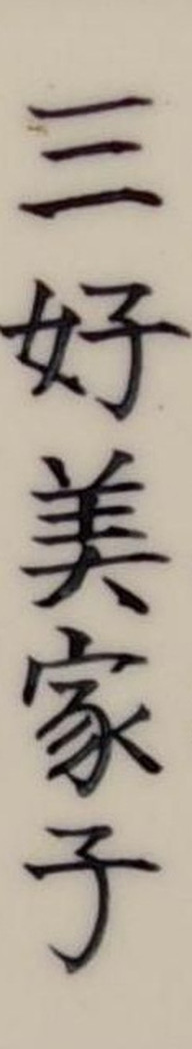三好美家子
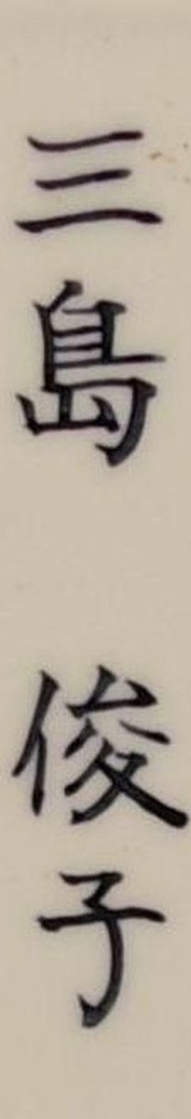三島俊子
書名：E~L
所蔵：高野山金剛峯寺
